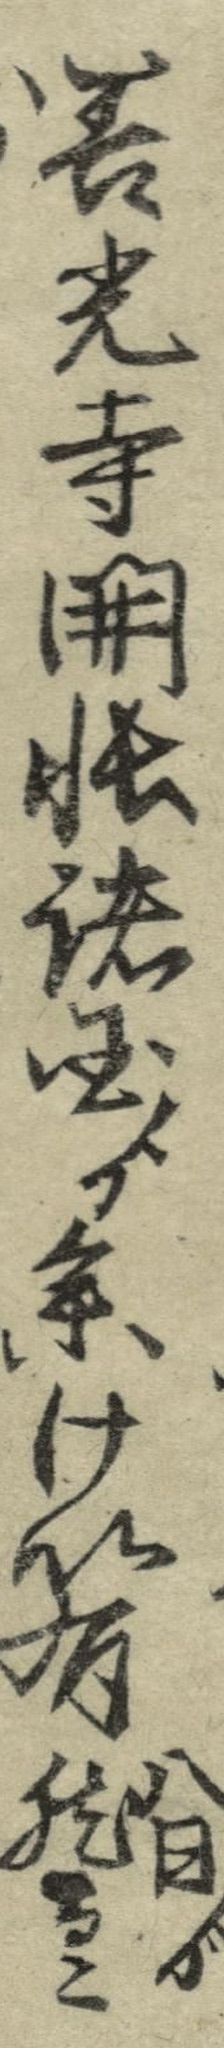善光寺開帳諸国ゟ参けい有然るニ
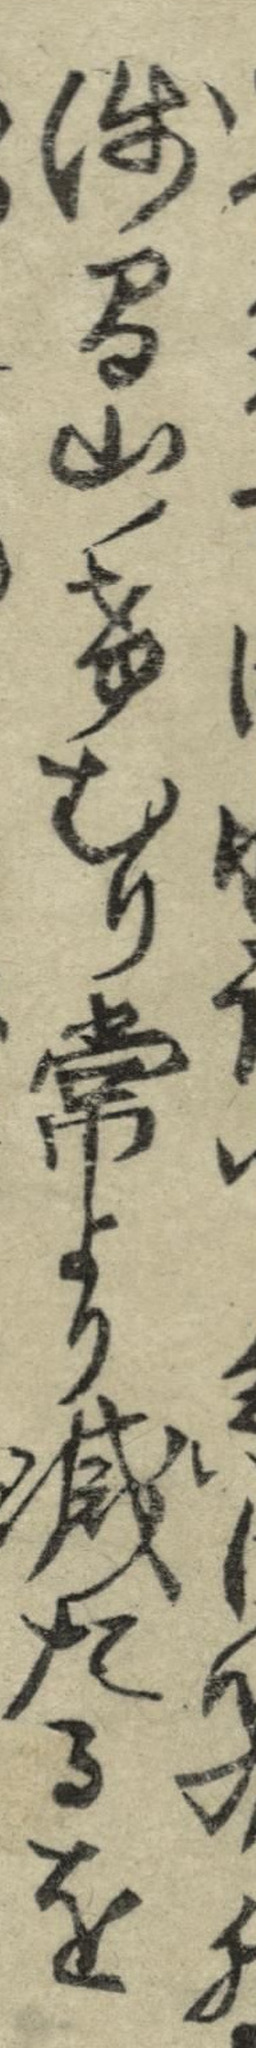浅間山けむり常より減たるを
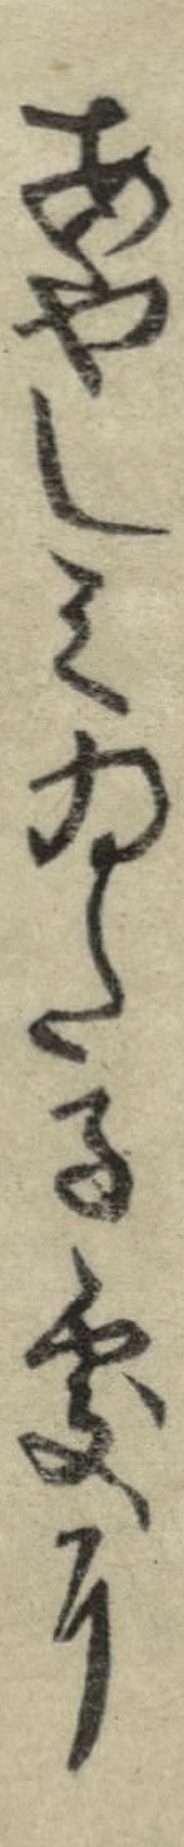あやしみゐたる処に
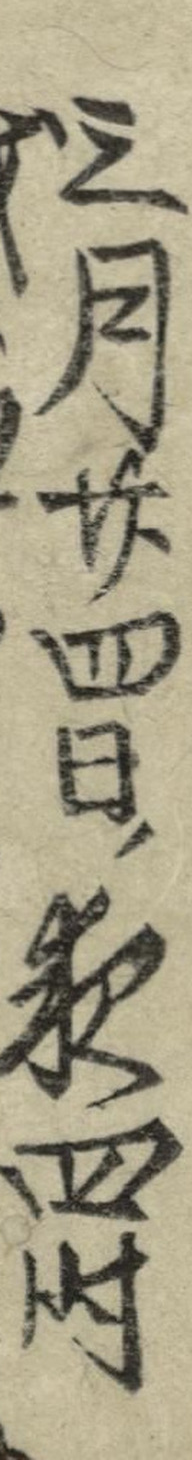三月廿四日ノ夜四時
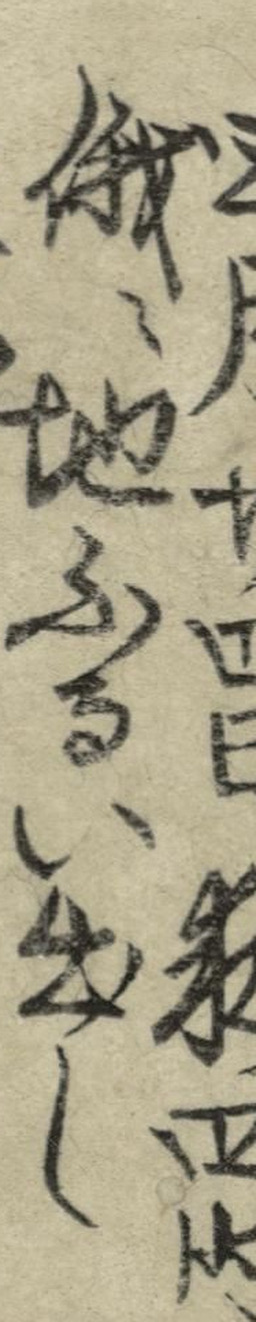俄ニ地ふるい出し
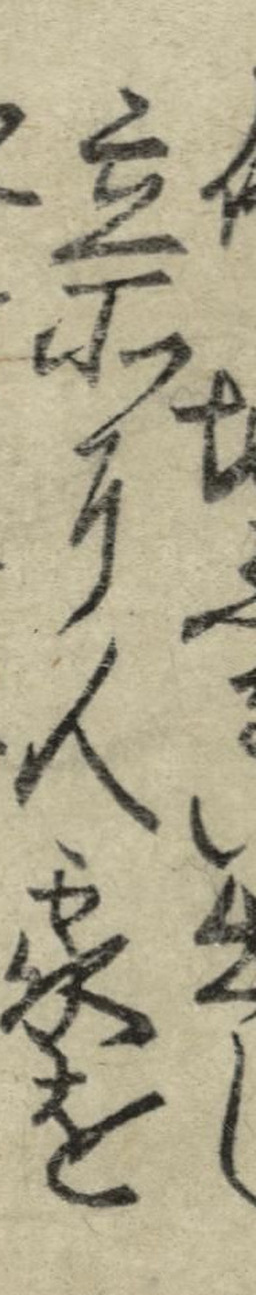立所に人家を
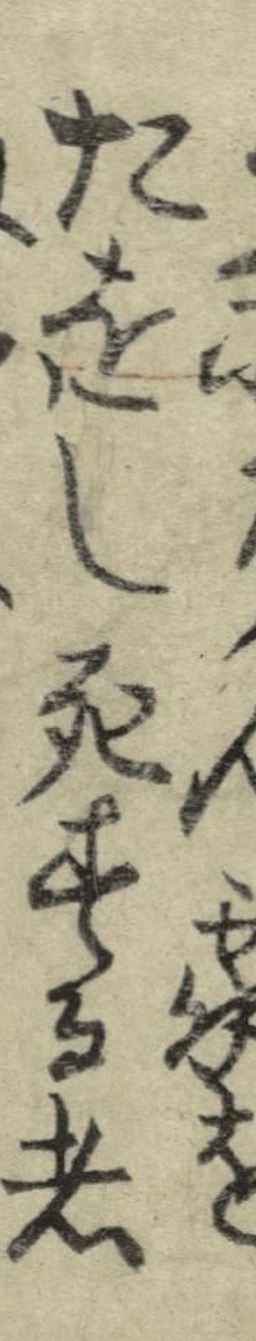たをし死する者
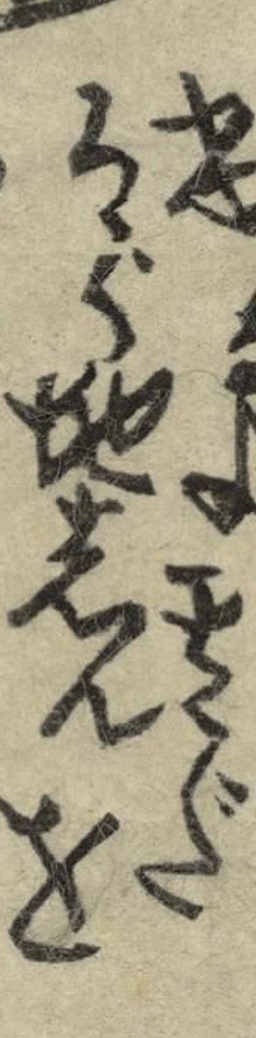うら地しんを
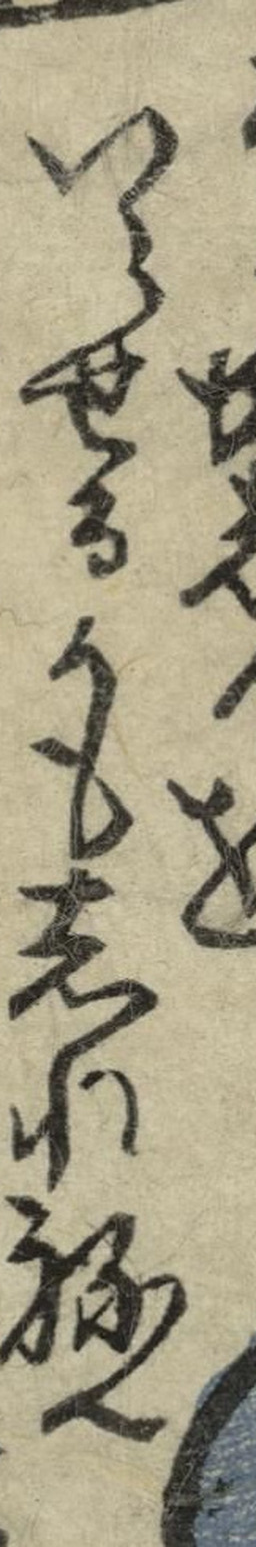いゝせるかもしれねへ
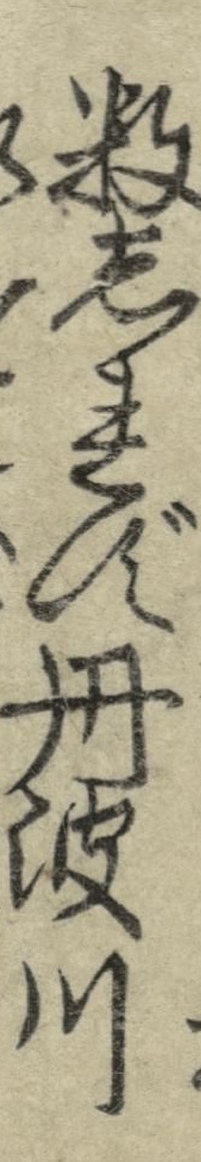数しれず丹波川
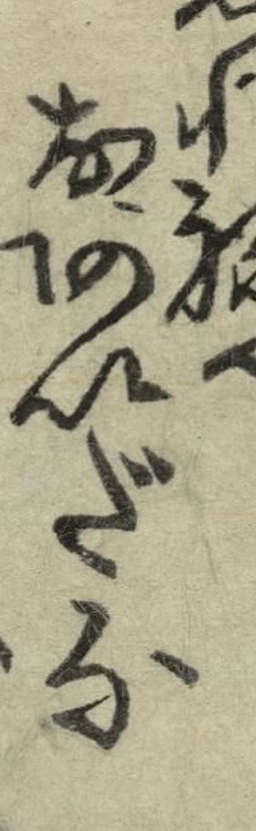おあいだな
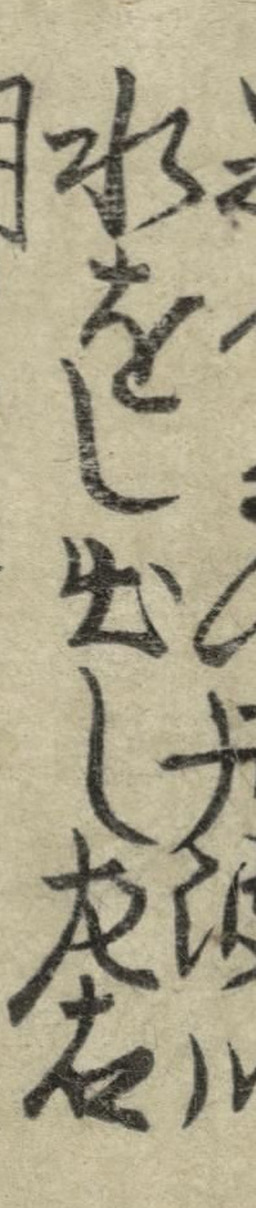水をし出し左右
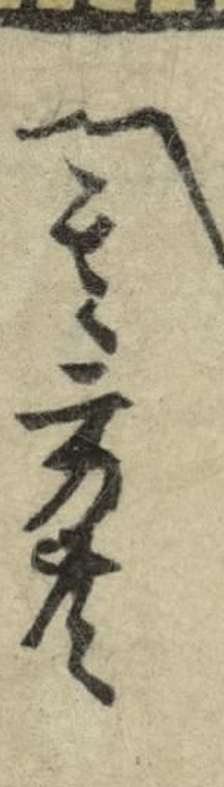〽其方共
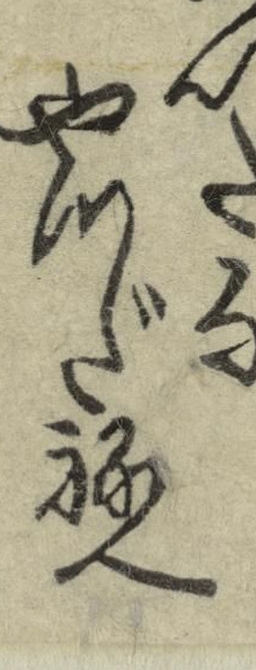やつだねへ
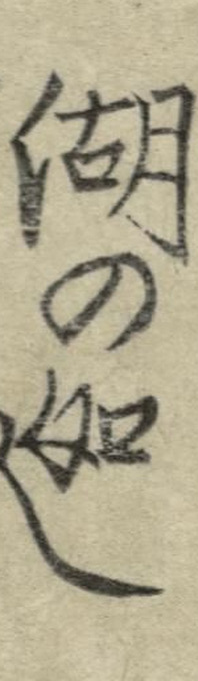湖の如し
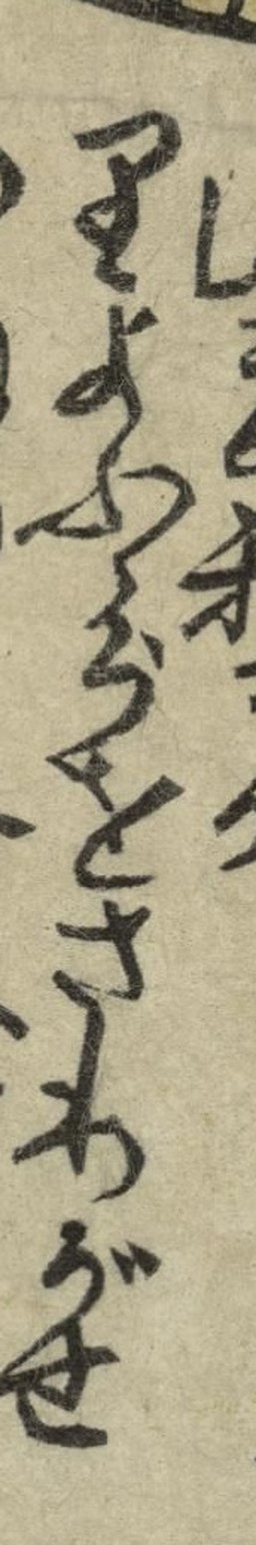りよふ分をさわがせ
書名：太平安心之為
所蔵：東京大学地震研究所図書室 Earthquake Research Institute Library, The University of Tokyo, JAPAN
